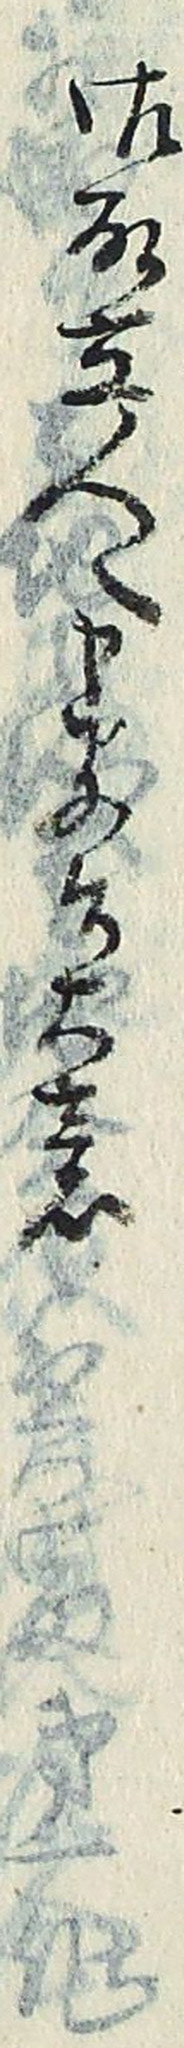御取立人へ申聞候大意
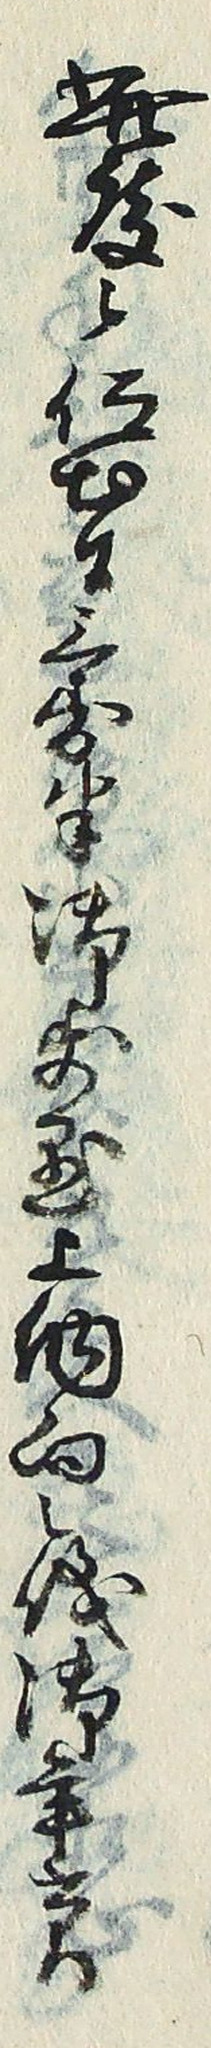此度被仰付候三歩半御歩懸上納向之儀御年貢
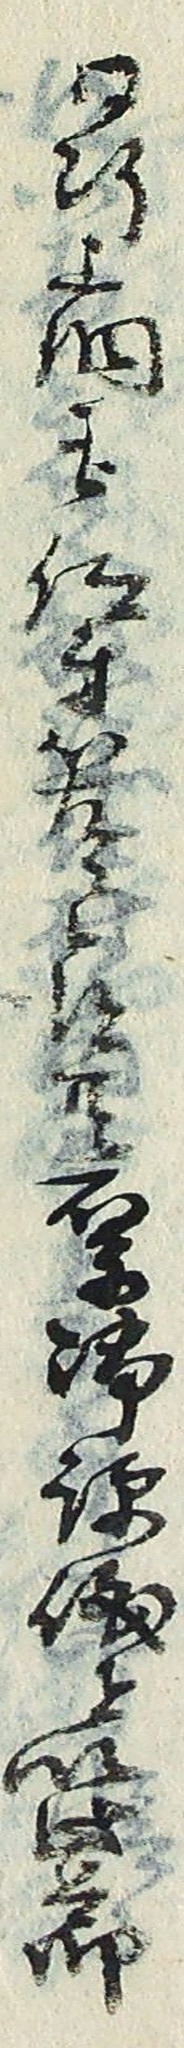同断上納被仰付筈ニ候得共厚御評儀を以此節
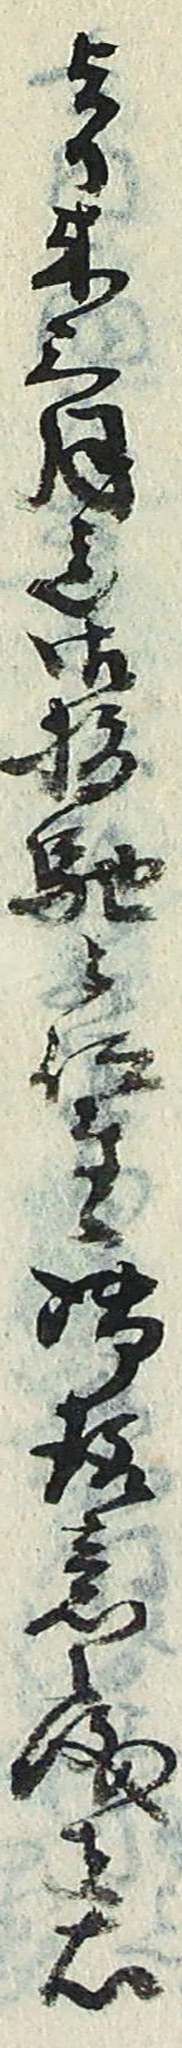より来三月迄御指馳被仰付候御趣意之儀者右
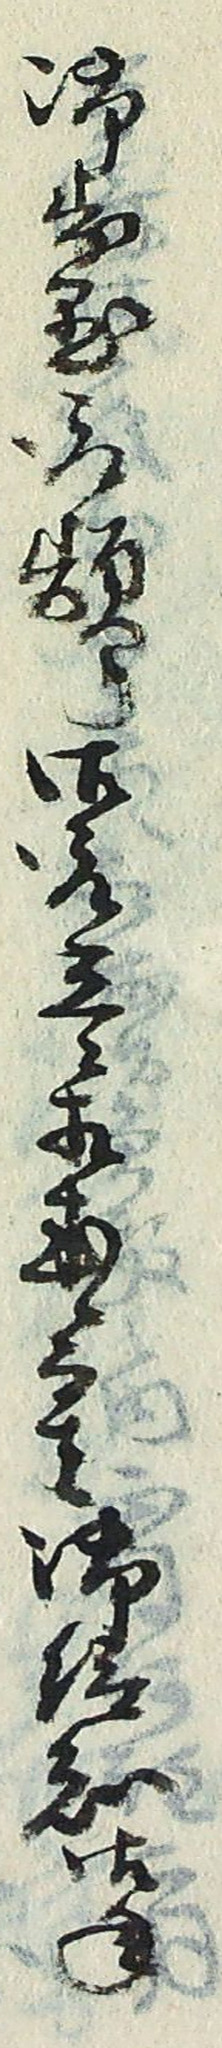御歩懸取頻り御取立ニ相成候而者御給知御年
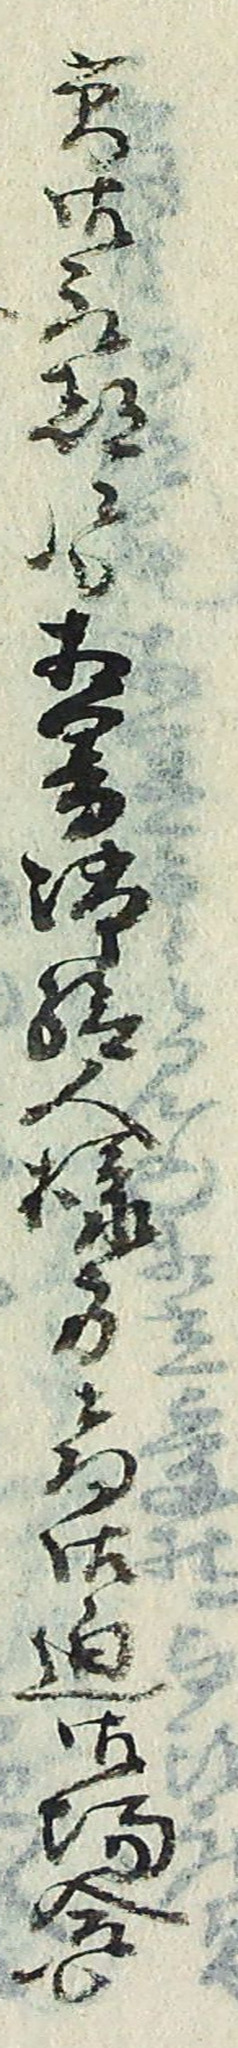貢御取都ニも相響御給人様方被為御迫御場合も
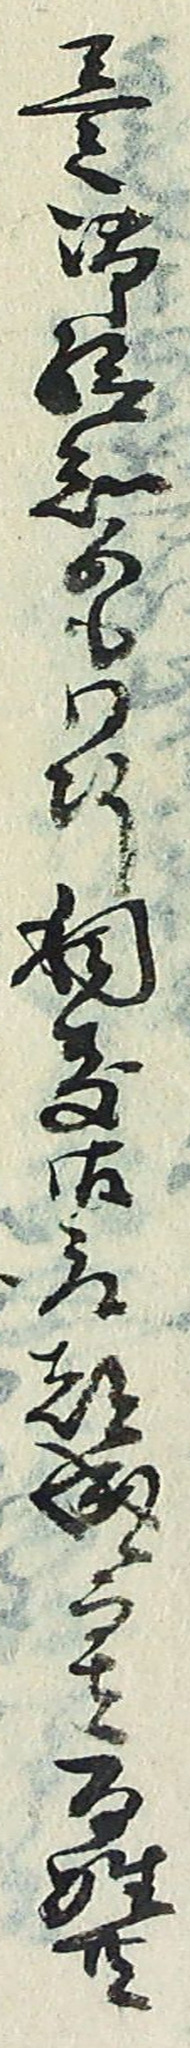有之御給知ゟも同断稠敷御取都成候而者百姓共
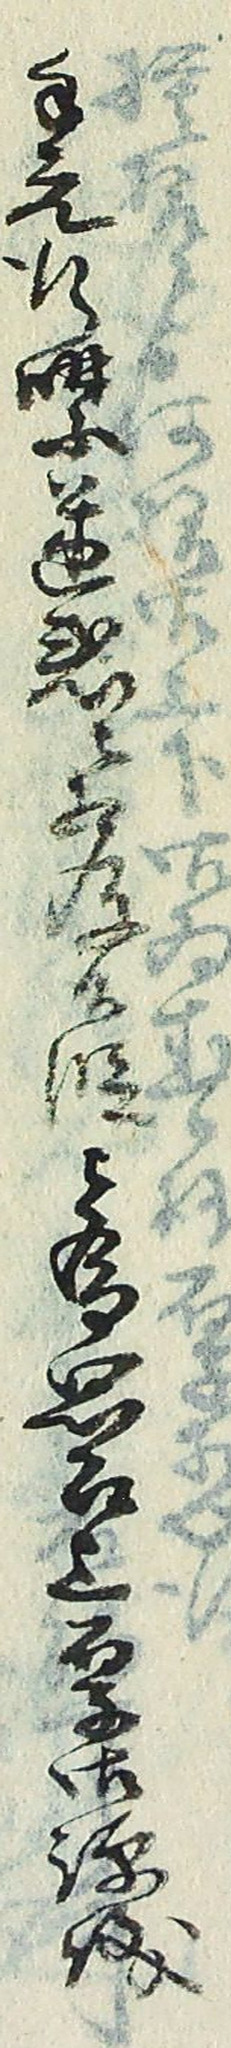手元行噤迷惑ニ相及候段被為思召上厚御評儀
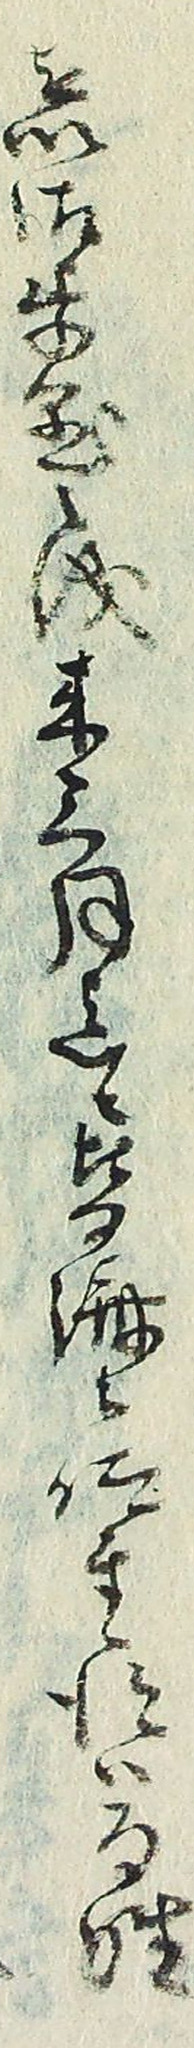を以御歩懸之儀来三月迄ニ皆済被仰付候得ハ百姓
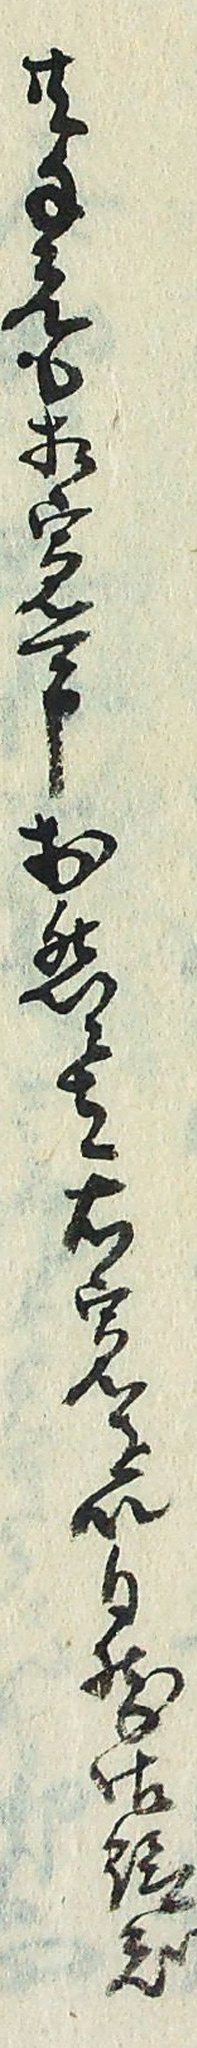共手元も相寛可申於然ニ者右寛を以自然御給知
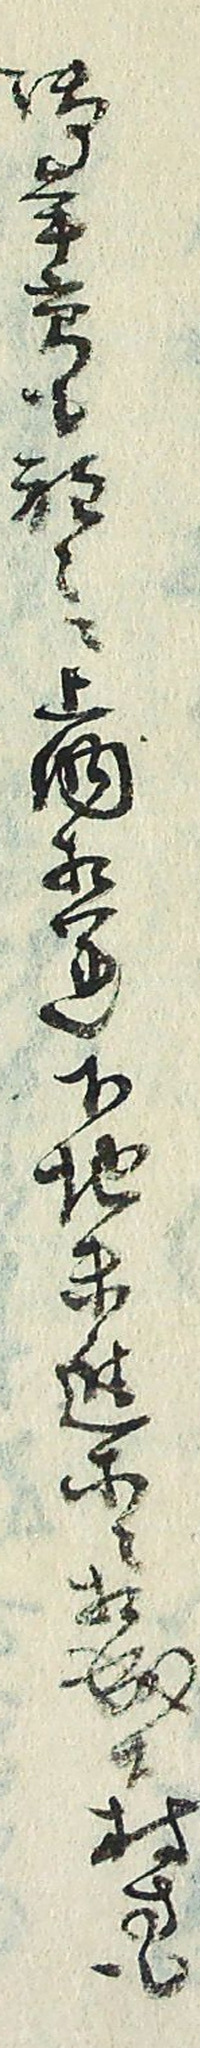御年貢も程々ニ上納相運下地未進等ニ相成候村方も
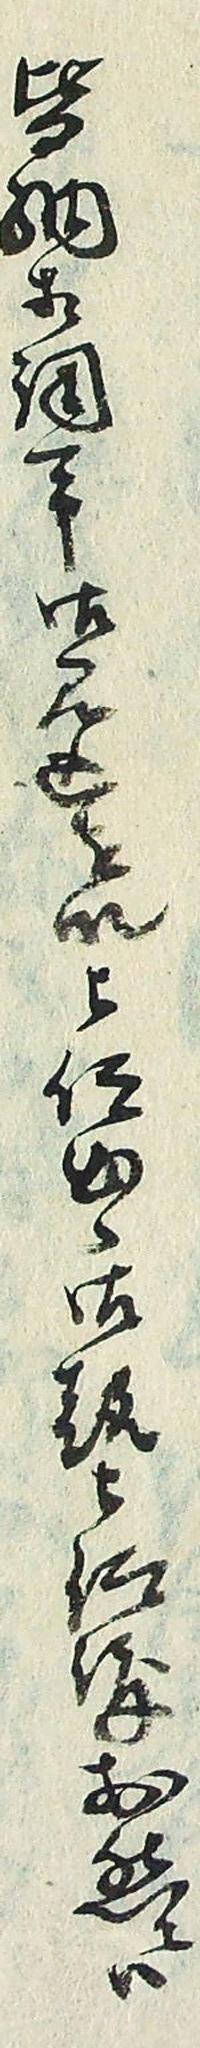皆納相調可申御見込を以被仰出候御趣被仰渡於然ニハ
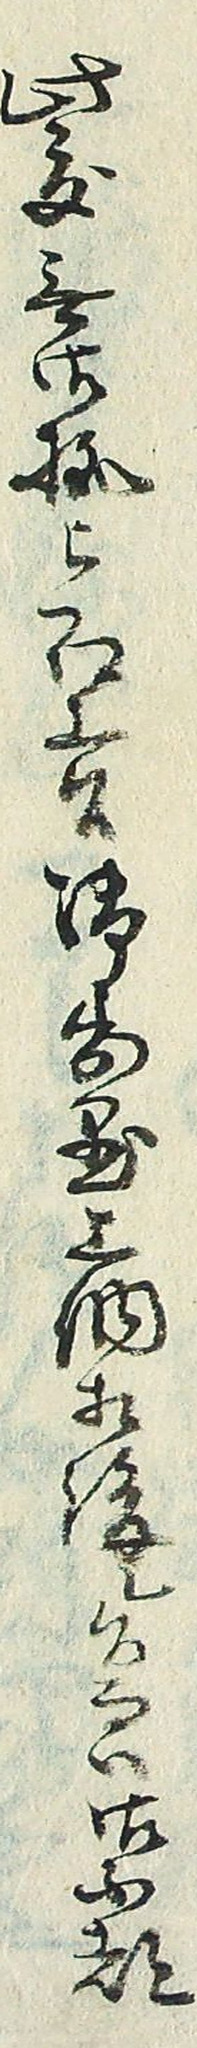此度無御様被召上候御歩懸上納相後レ候而ハ御不都
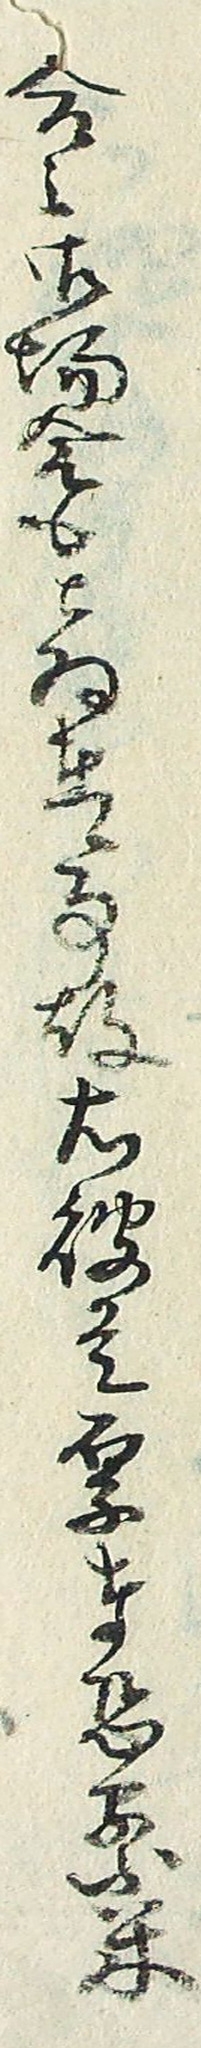合之御場合も被為在候事故右彼是厚奉恐察米

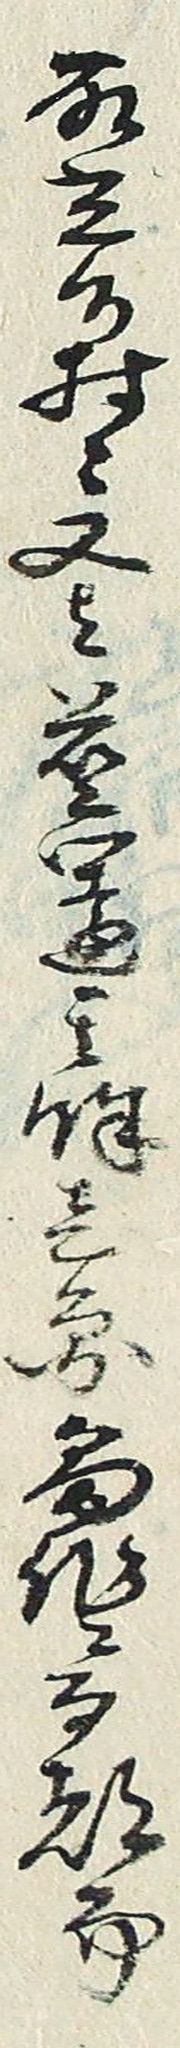取立候村々又者藍園其餘壱圓畠作ニ而都而
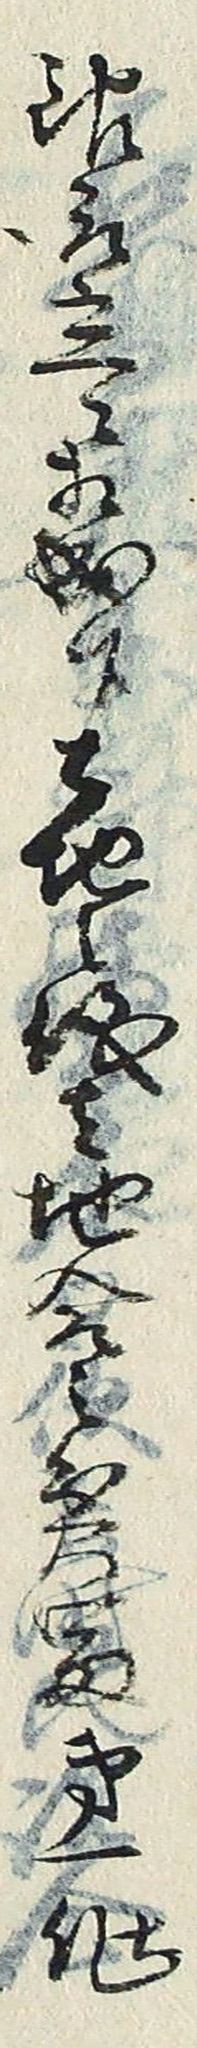銀取立ニ相成候土地之儀者地合之貧冨第一作
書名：諸御趣意書并御下知向之写
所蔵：鳴門教育大学 Naruto University of Education
